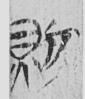則
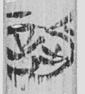訿
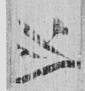之
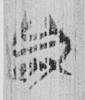凡
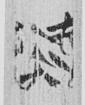欲
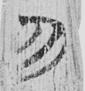勿
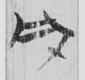凡
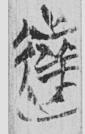○（失）
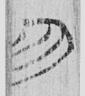勿
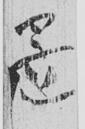危
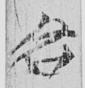各
